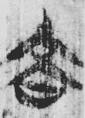吝（閔）
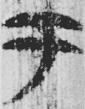于
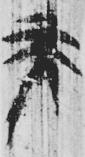天
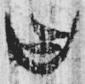曰
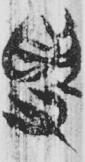受（紂）
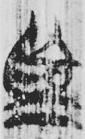爲
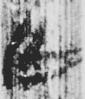亡（無）
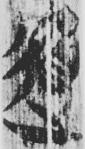道
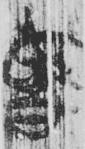○（昏）
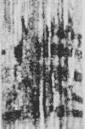者（諸）
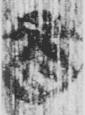百
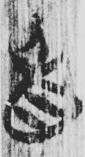眚（姓）
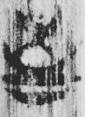至
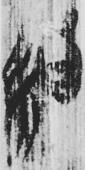約
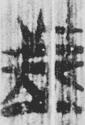者（諸）
